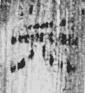亓
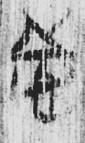志
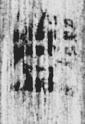者
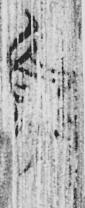○（寡）
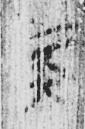矣
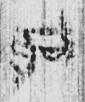戕（莊）
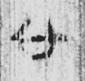公
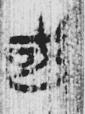或（又）
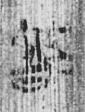䎽
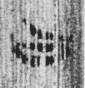曰
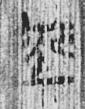𫊟（吾）
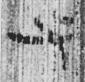又
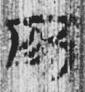所
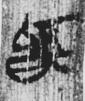䎽（聞）
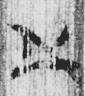之
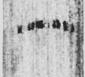一
